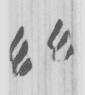𢆶
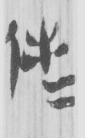{人丰}=
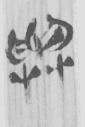與
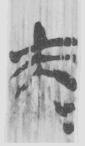夫=
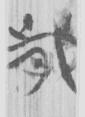歲=
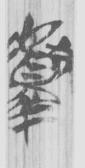獻
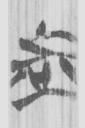者
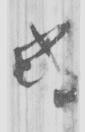女
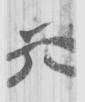亓
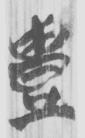豊
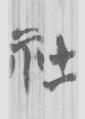社
